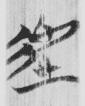𫊟
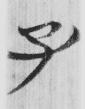子
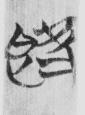既
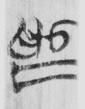爲
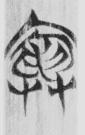{宀黽廾}
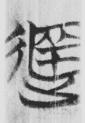{辶匚羊}
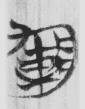軍
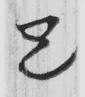巳
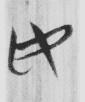女
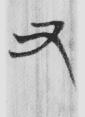又
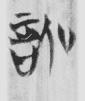訛
